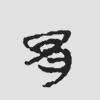日月
